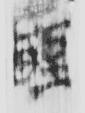聖
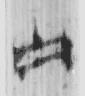士
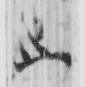之
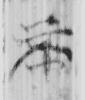不
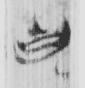由
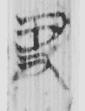卑
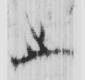之
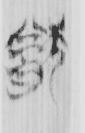猶
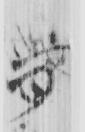歲
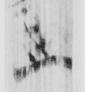之
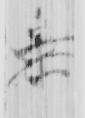不
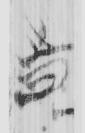{之日}
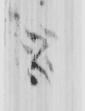水
